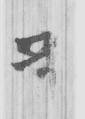邑
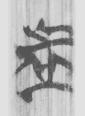者
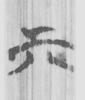亓
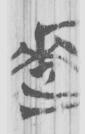麥
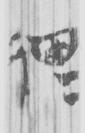{彳田}=
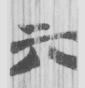亓
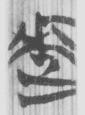麥
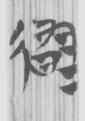徇=
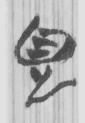見
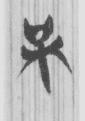某
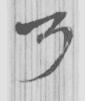乃
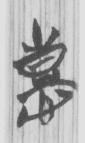𢝫
